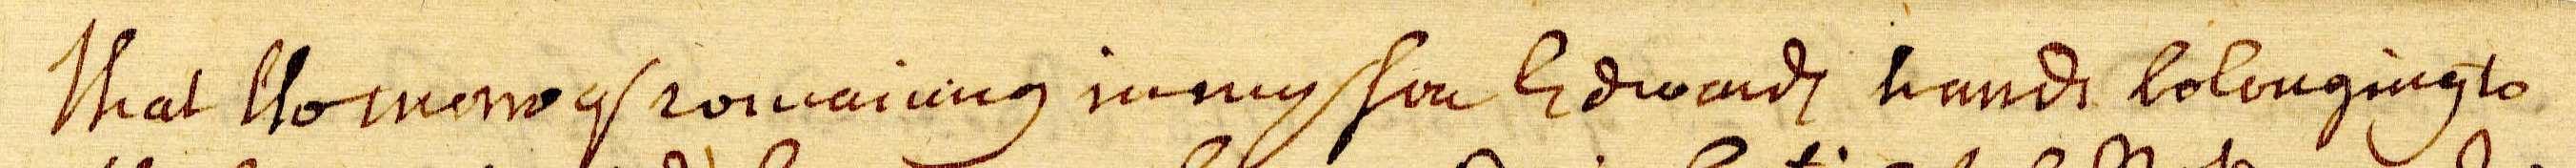that No money receiving in my son Edwards hands belonging to
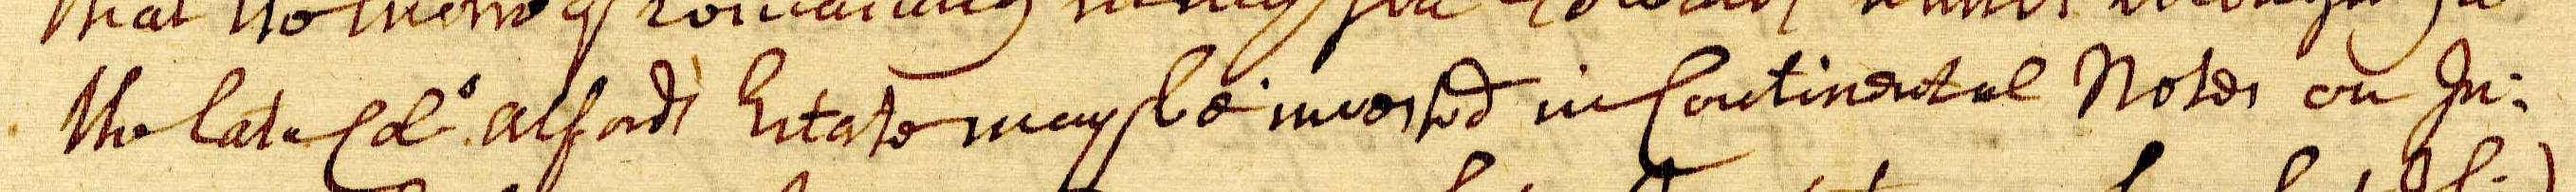the late Col^o. Alford's Estate may be invested in Continental Notes on In-
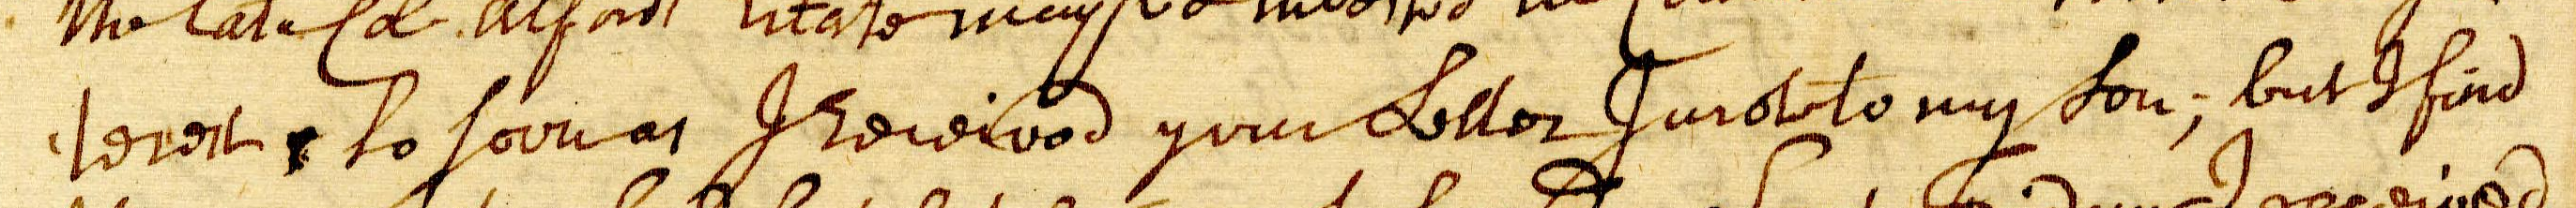terest so soon as I received your Letter I wrote to my Son; but I find
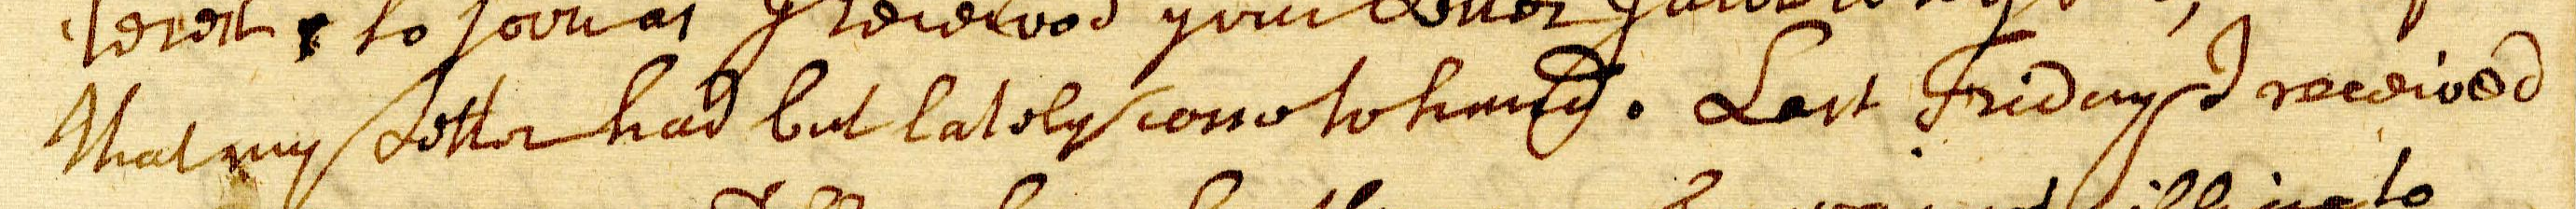that my Letter had but lately come to hand. Last Friday I received
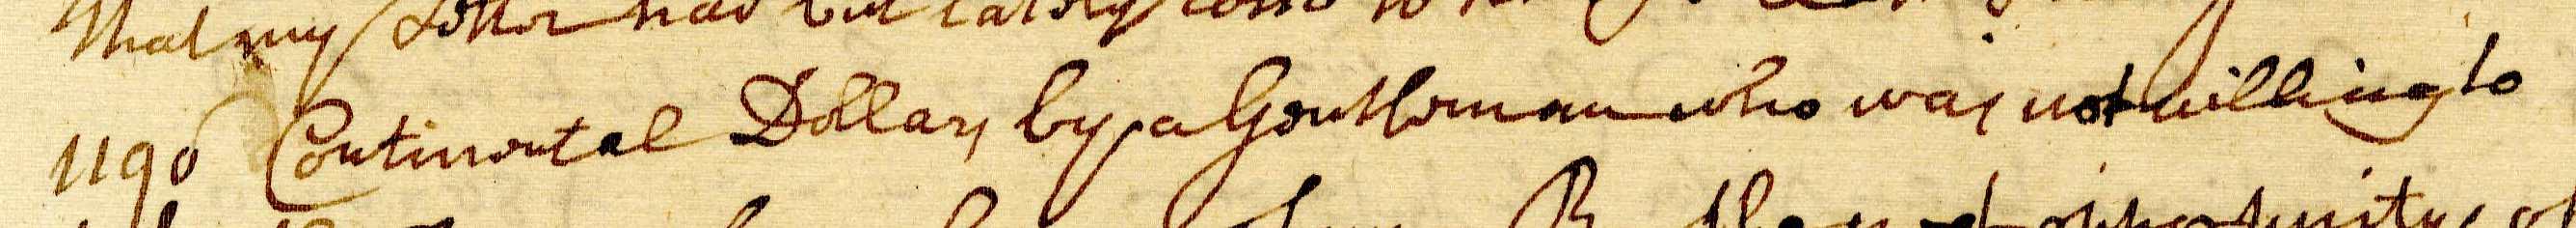1190 Continental Dollars by a Gentleman who was not willing to
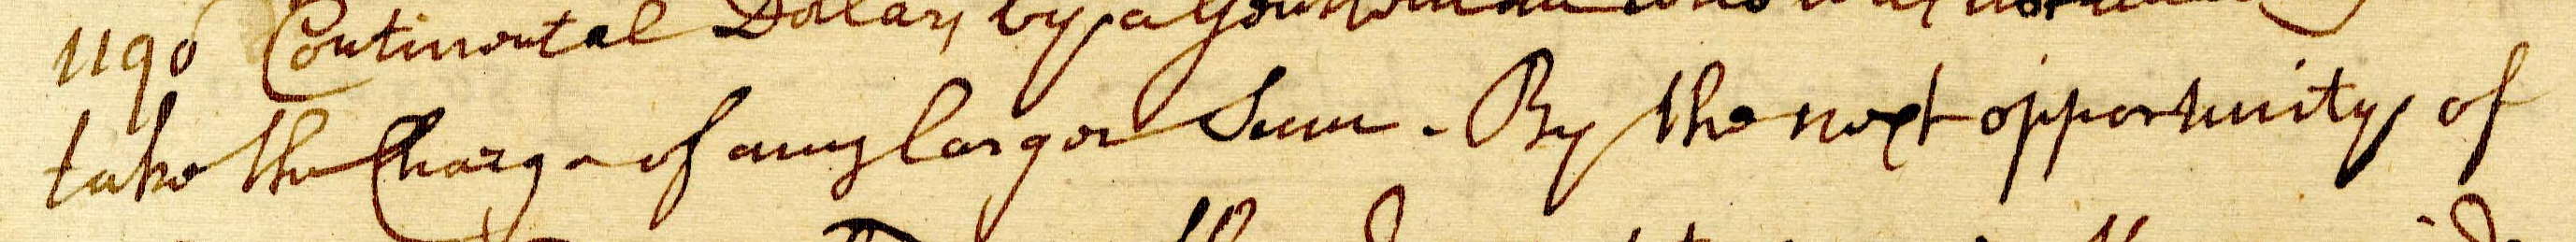take the Charge of any larger sum. By the next opportunity of
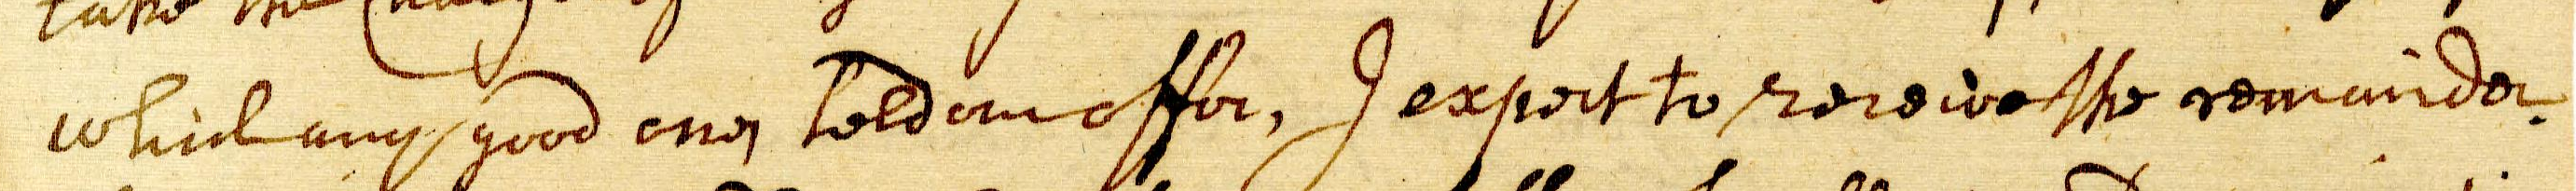which any good ones held on offer, I expect to receive the remainder
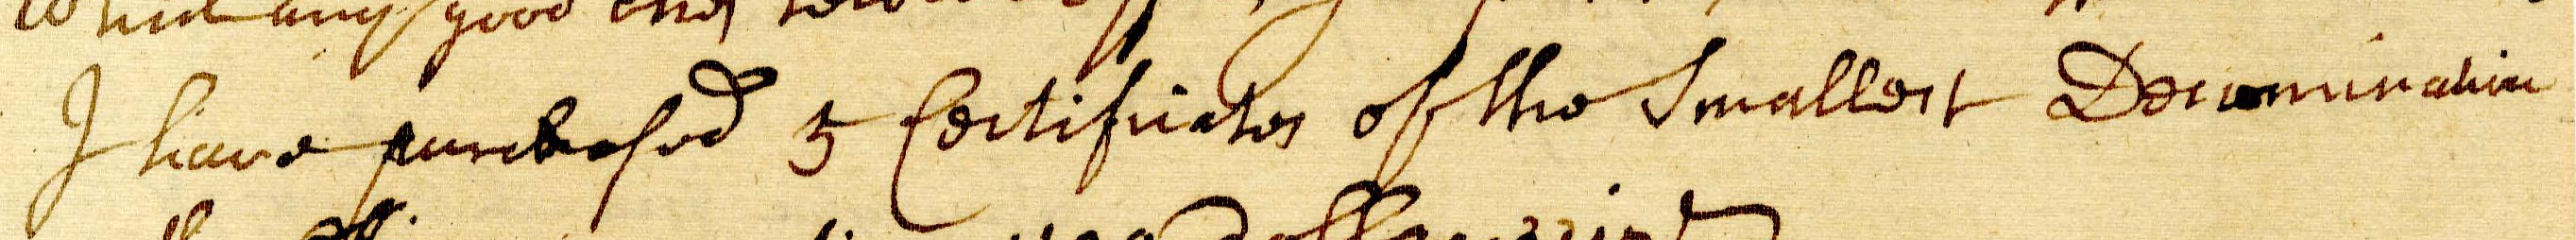I have purchased 5 Certificates of the Smallest Denomination
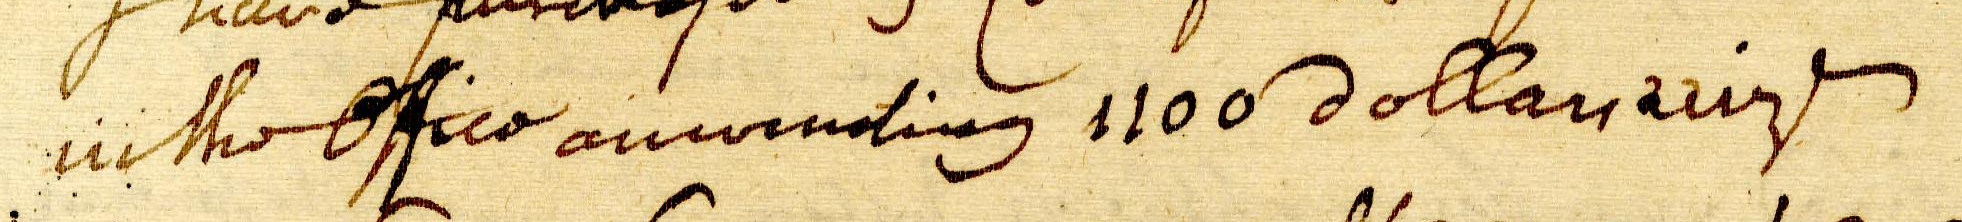in the Office amounting 1100 dollars viz^t
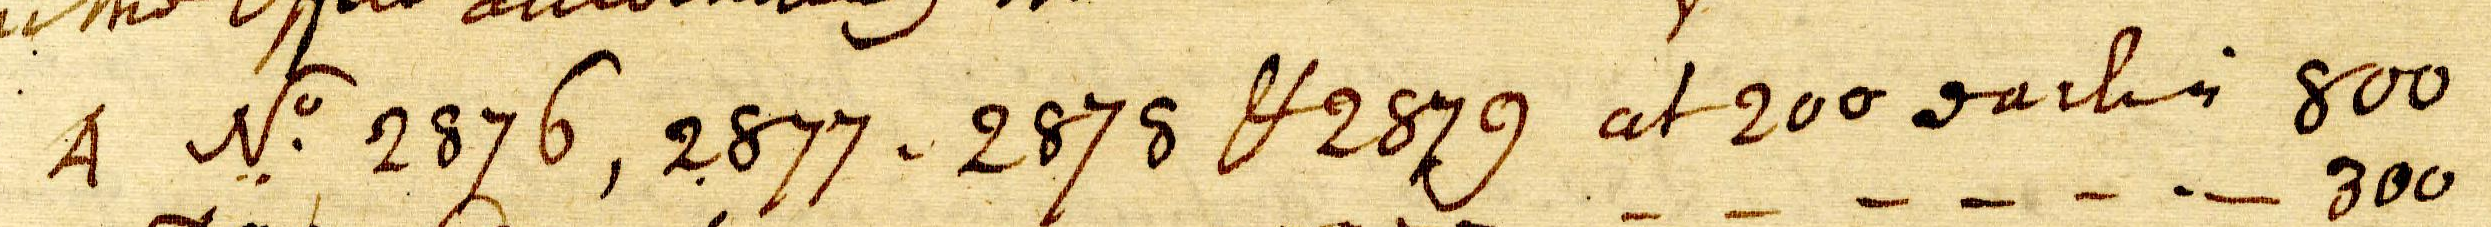4 N^o. 2876, 2877-2878 & 2879 at 200 each is 800
